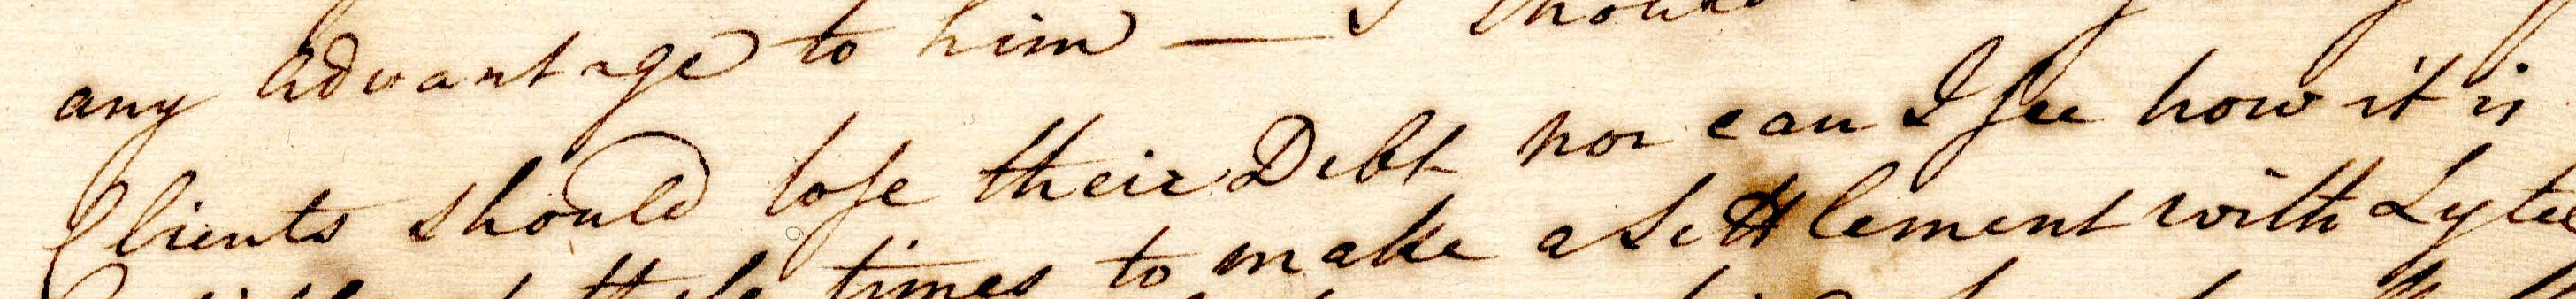Clients should lose their Debt nor can I see how it is
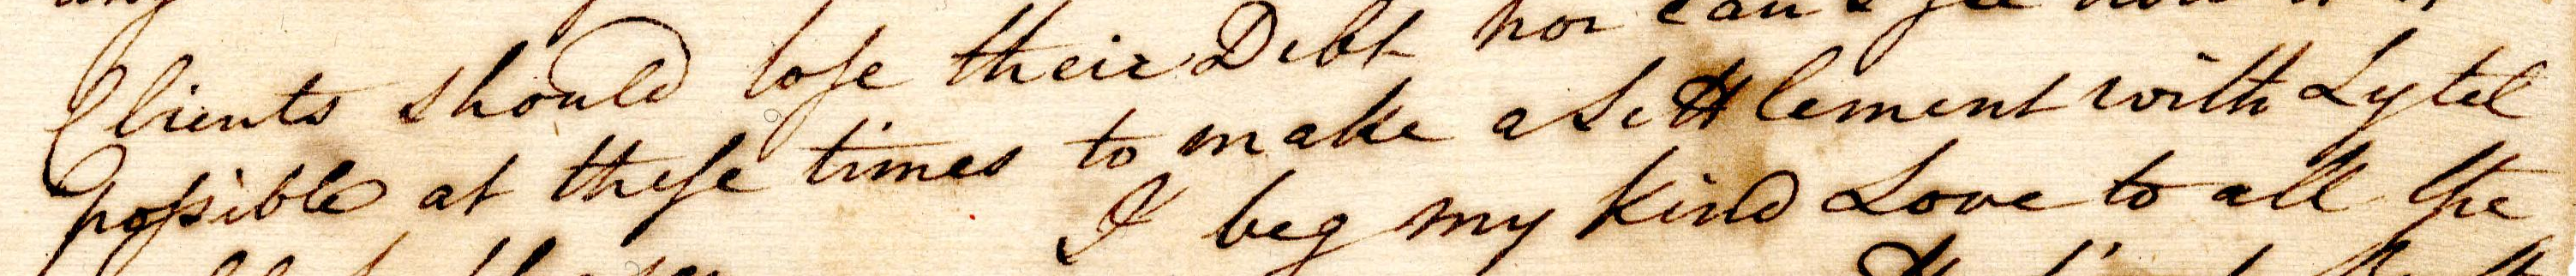possible at these times to make a Settlement with Lytel
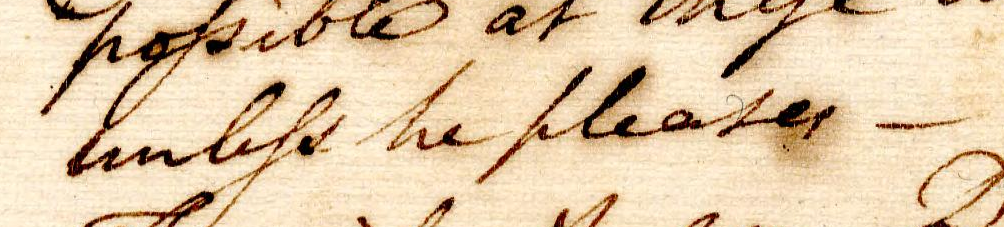unless he pleases-
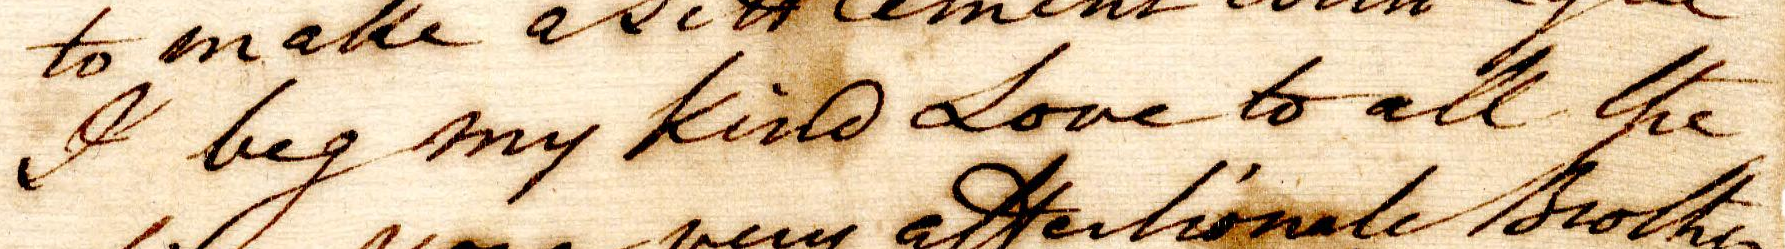I beg my kind Love to all the
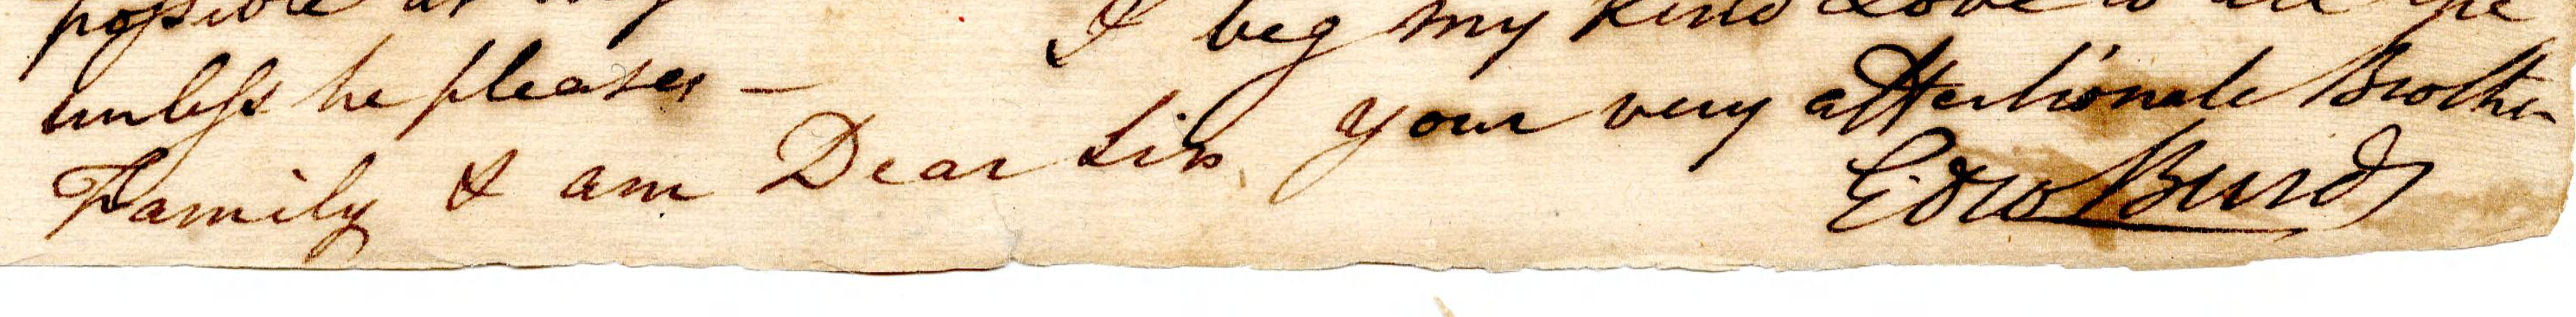family & am Dear Sir your very affectionate Brother
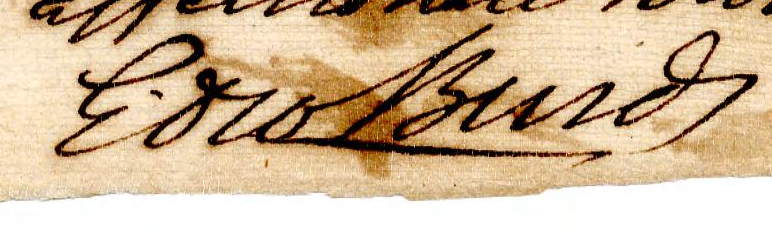Edw. Burd
